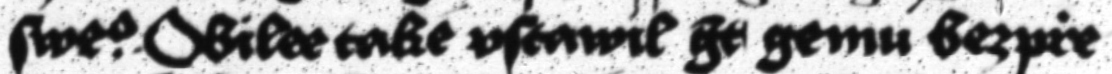ſwe°. Obilee také vſtawil ḡt gemu bezpṙe
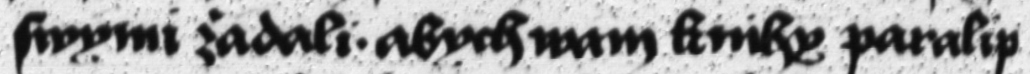swymi žadali. abych wam knihy paralip
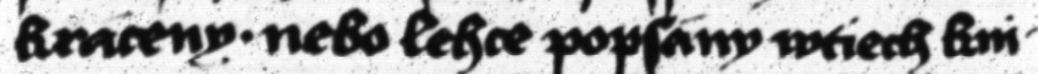kráceny. nebo lehce popſány wtiech kni
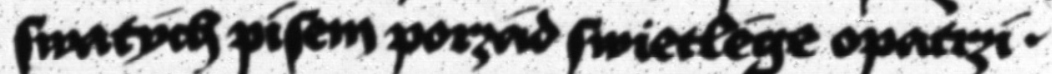ſwatých píſem porzád ſwietlége opatrzí
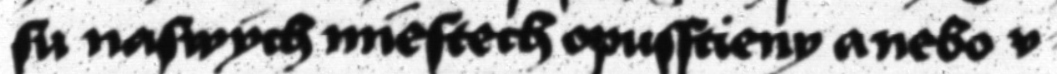ſu naſwých míeſtech opuſſtieny a nebo v
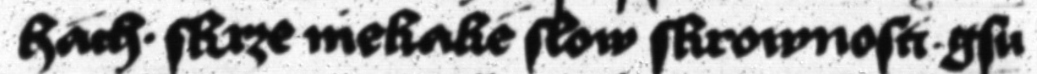hách. ſkrze niekaké ſlow ſkrownoſti. gſu
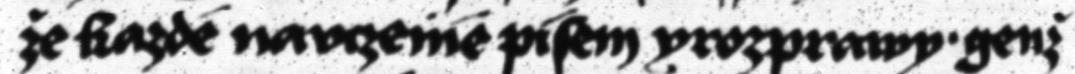že kazdé navczeṅíe píſem yrozprawy. genž
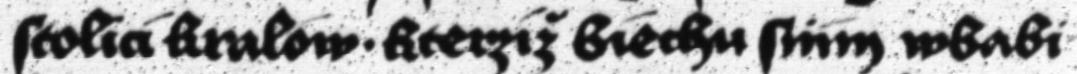ſtolicí kralów. kterzíž bíechu ſṅím wbabi
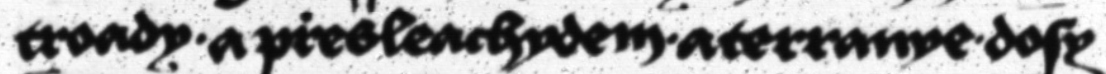troady. a pṙešleachydem aterranye. doſy
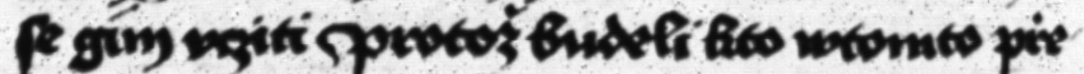ſe gím vziti Protož budeli kto wtomto pṙe
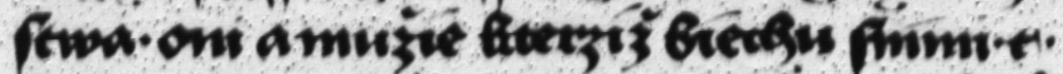ſtwa. oni a mužíe kterzíž bíechu ſními t.
